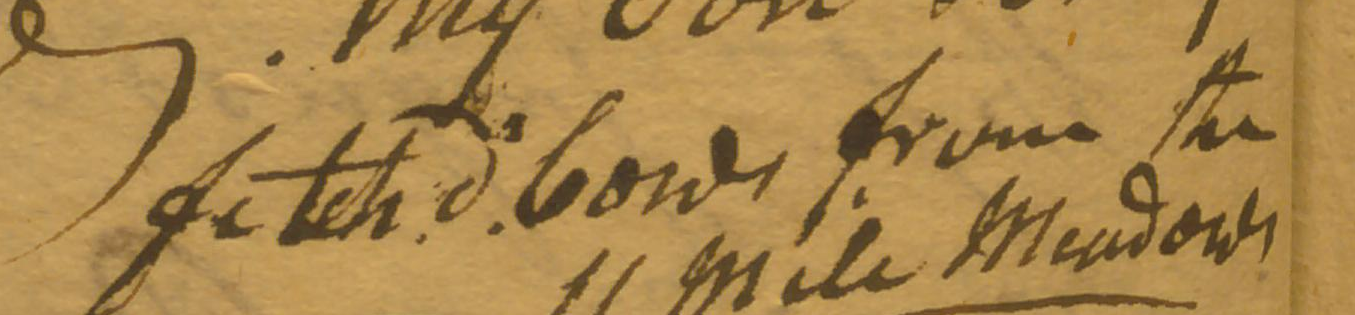fetch^d. Cows from the
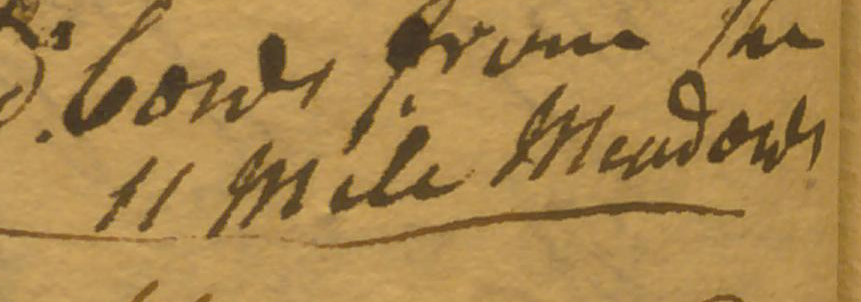11 Mile Meadow
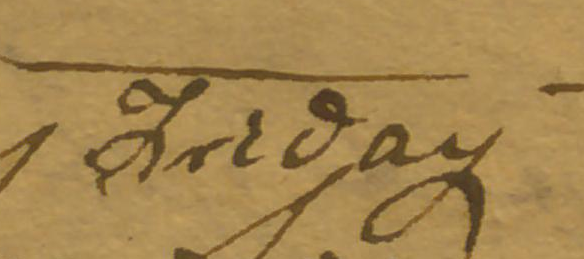Friday
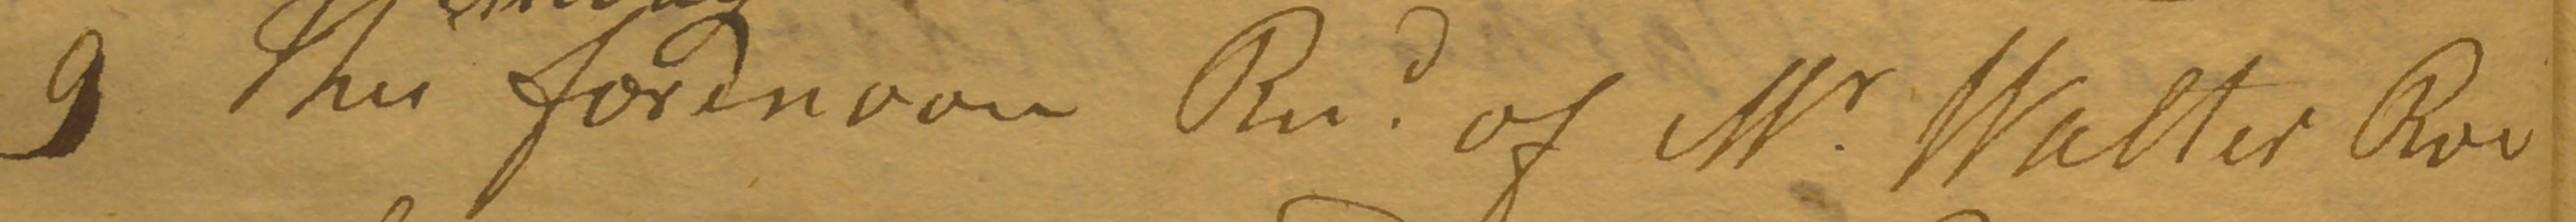9^th This forenoon Rec^d. of M^r. Walter Row
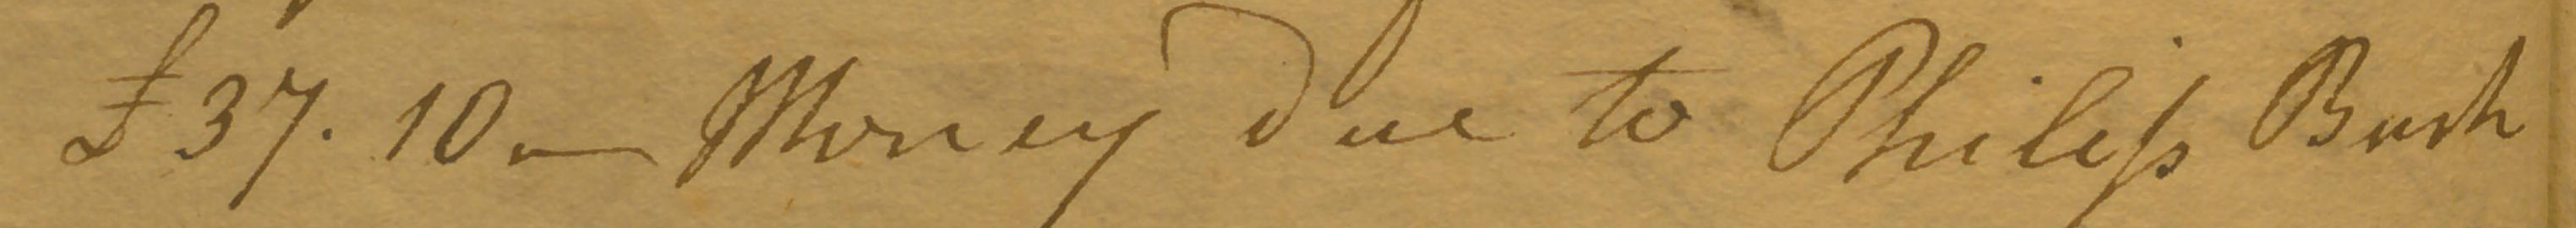£37.10- Money due to Philip Bush
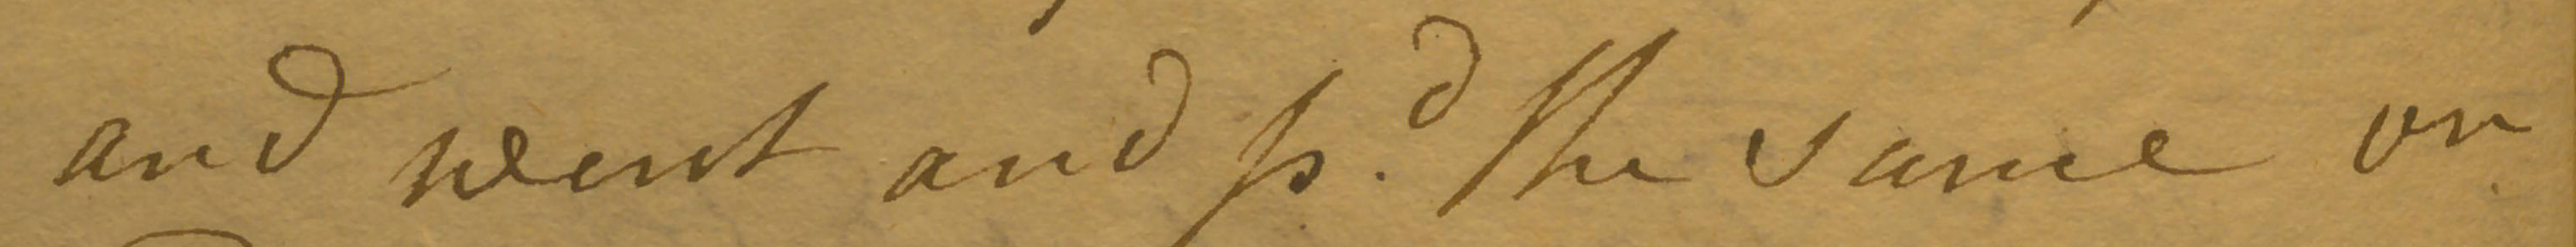ane went and p^d. the same on
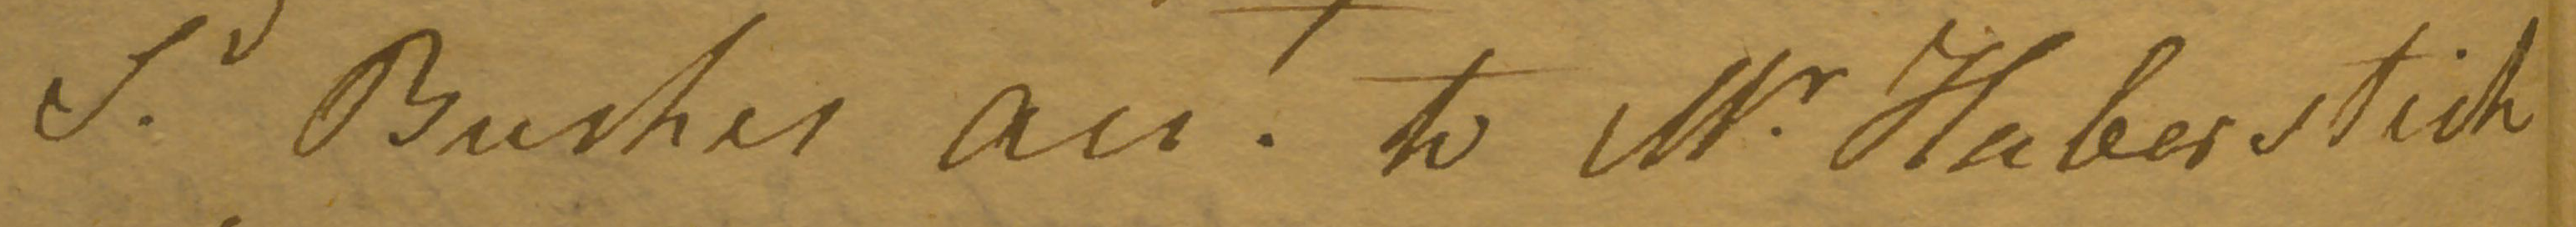J. Bushes acc^t. to M^r. Haberstick
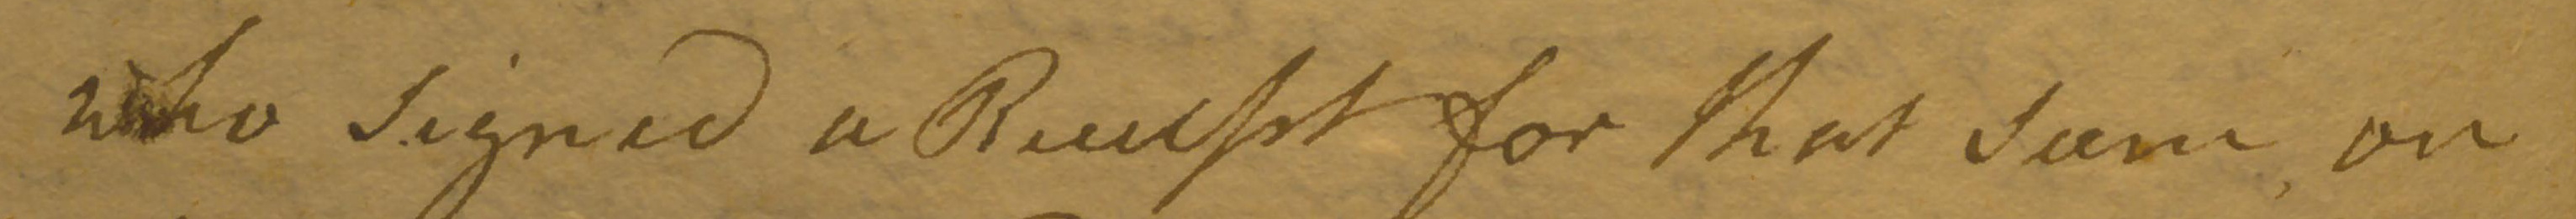who signed a Receept for that sum on
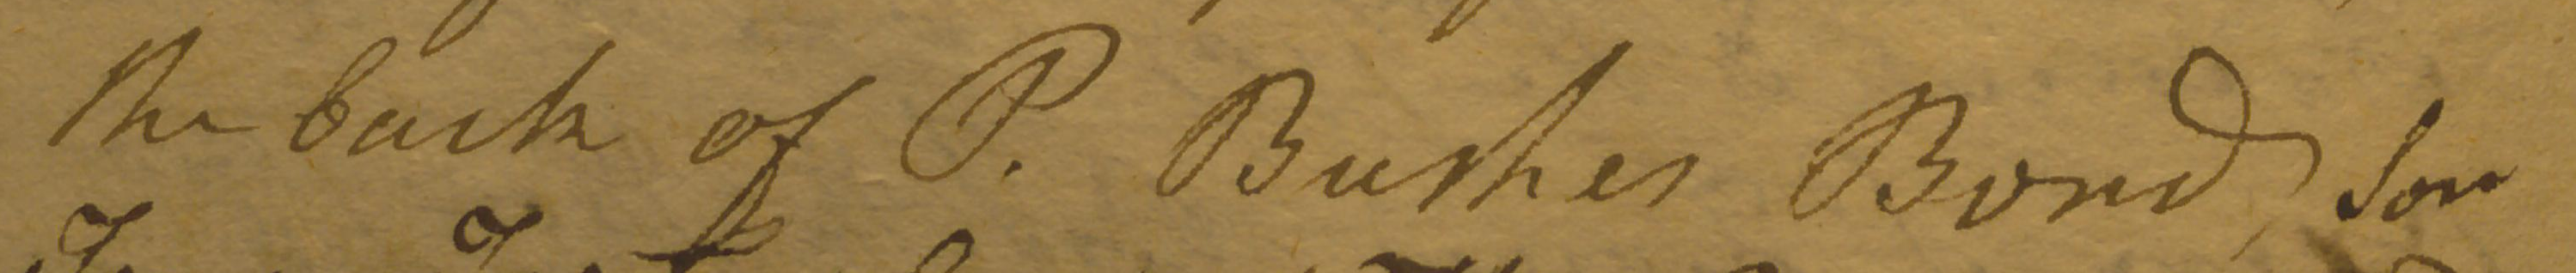the back of P. Bushes Bond son
